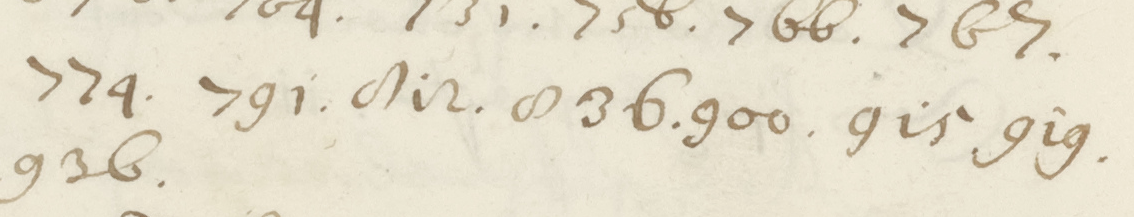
774, 791, 812, 836, 900, 915 919.
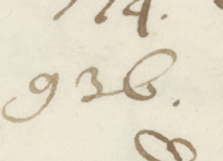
936.
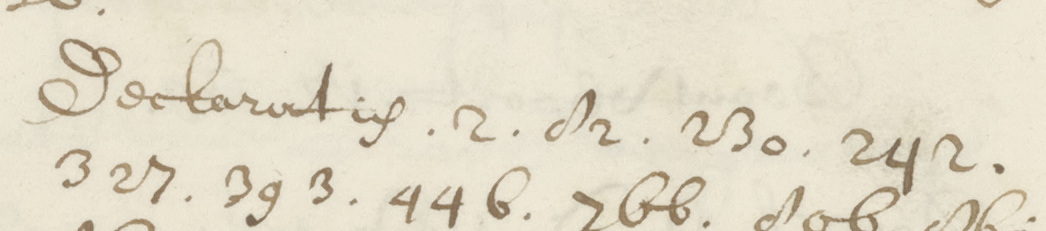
Declaratien, 2, 82, 230, 242,
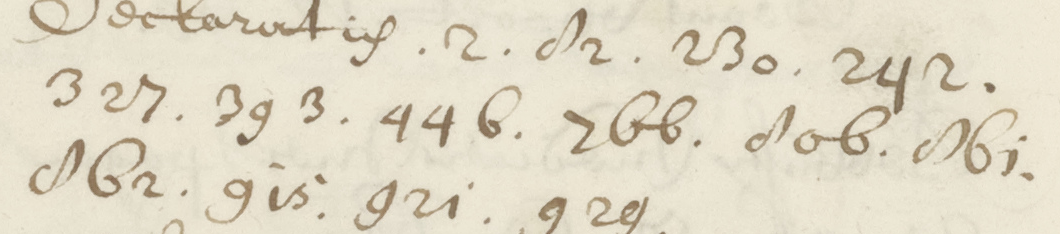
327, 393, 446, 766, 806, 861,
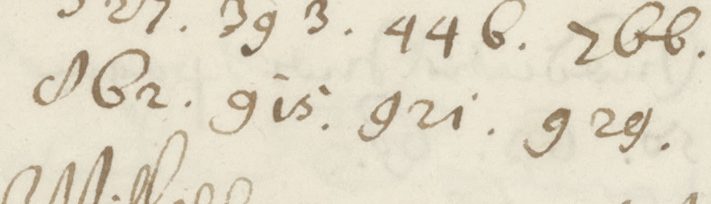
862, 915, 921, 929.
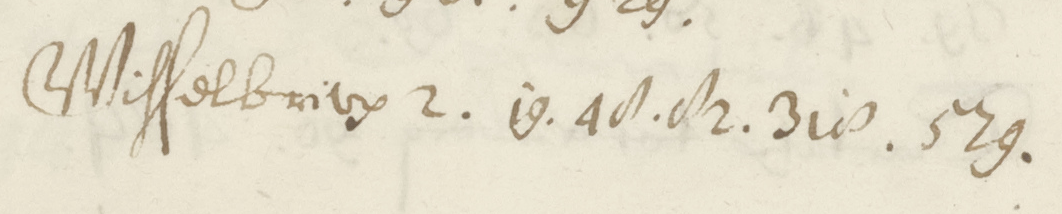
Wisselbriven 2, 19, 48, 82, 318, 579.
